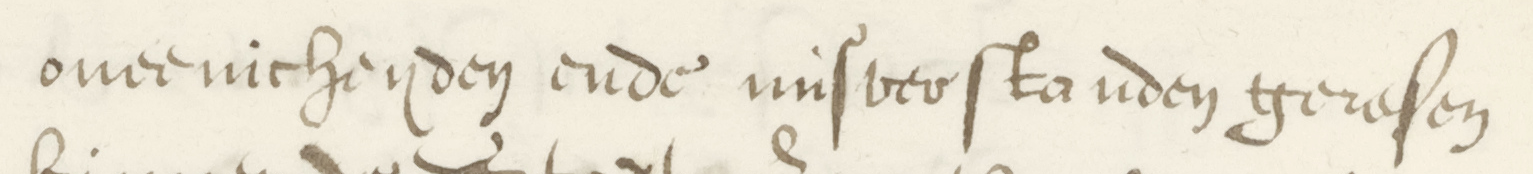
oneenicheyden ende misverstanden geresen
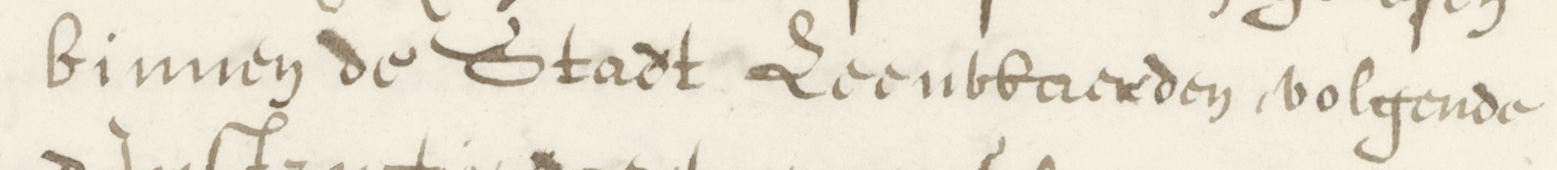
binnen de Stadt Leeuwaerden, volgende
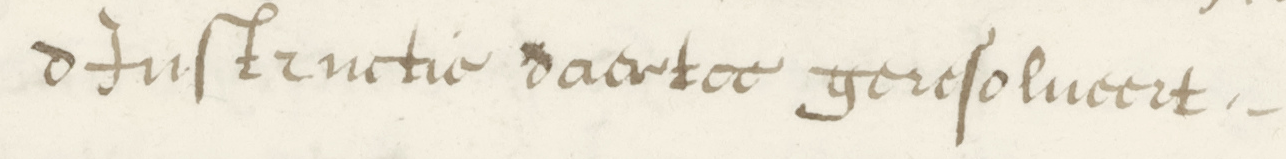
dInstructie daertoe geresolueert.
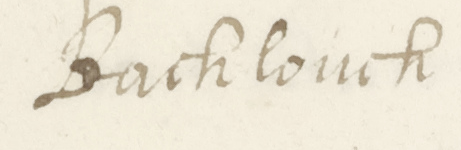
Bachlouch
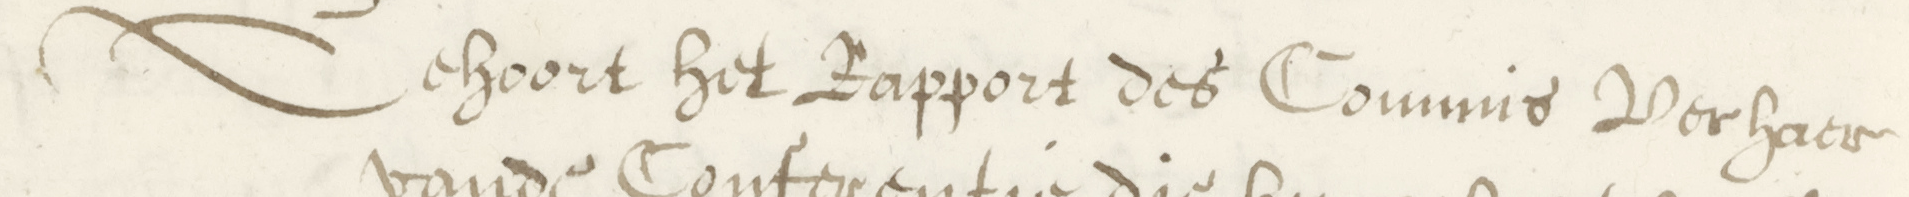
Gehoort het Rapport des Commis Verhaer
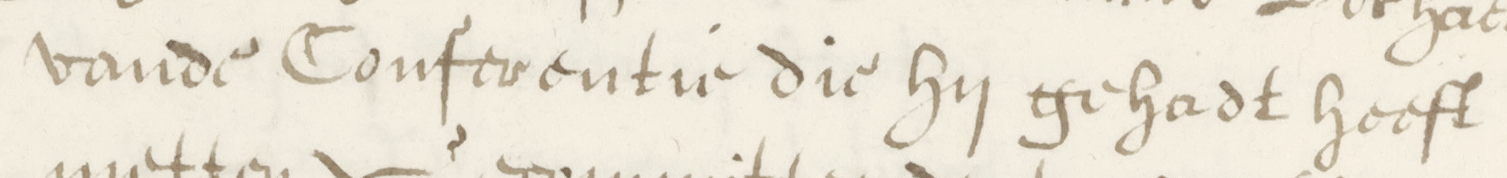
vande Conferentie die hy gehadt heeft
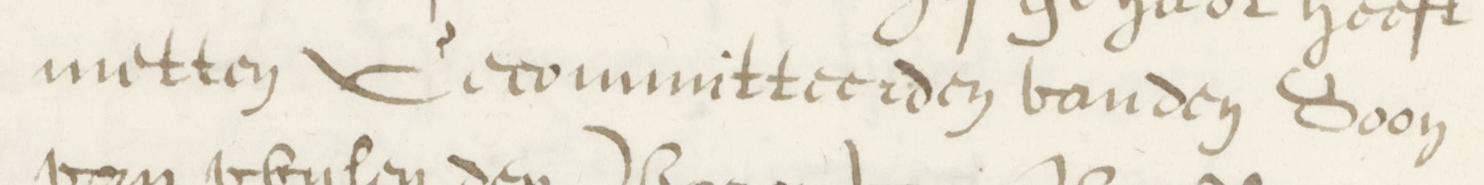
metten Gecommitteerden vanden Soon
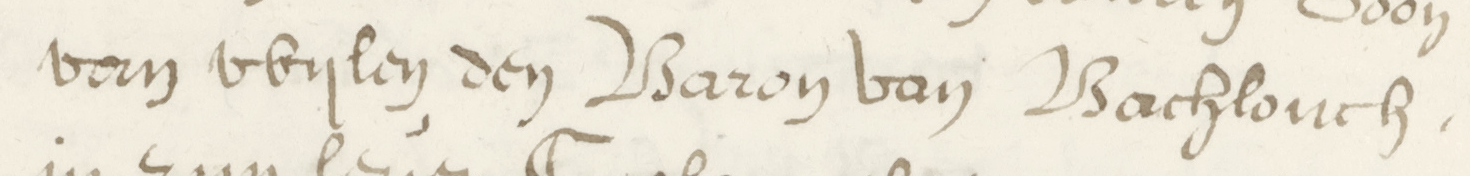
van wylen den Baron van Bachlouch,
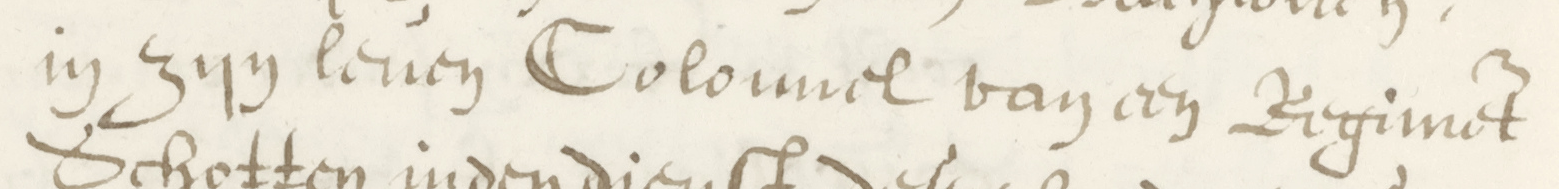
in zyn leuen Colonnel van een Regimet
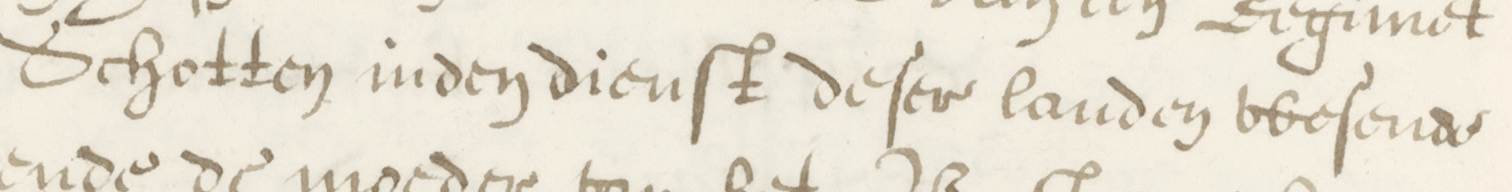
Schotten inden dienst deser landen wesende
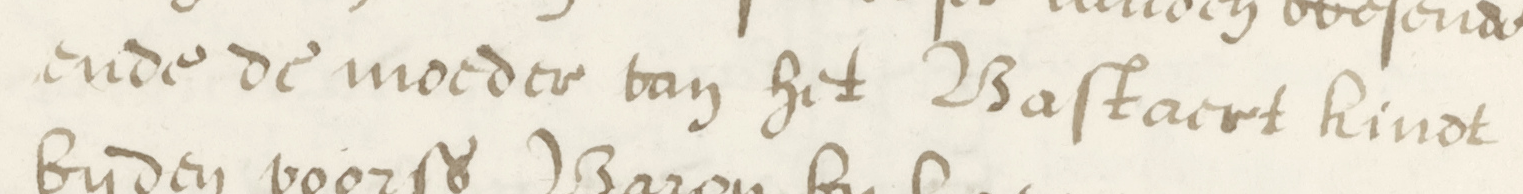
ende de moeder van het Bastaert kindt
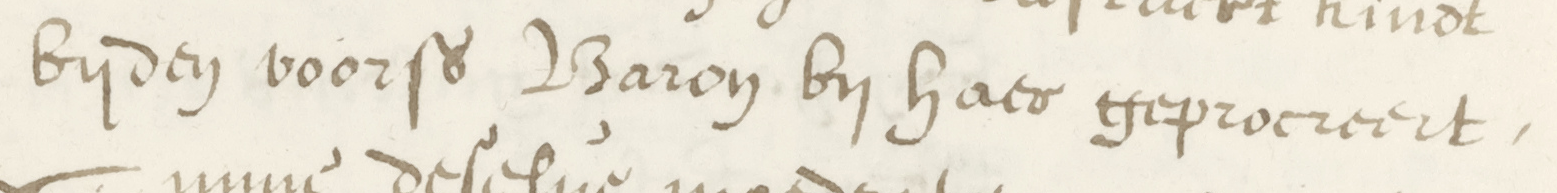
byden voors Baron by haer geprocreert,
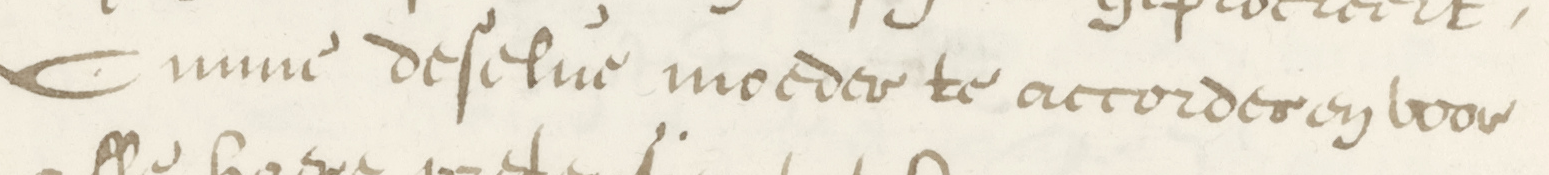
Omme deselue moeder te accorderen voor
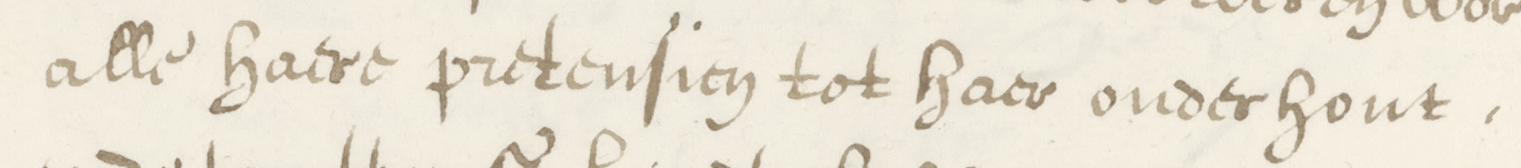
alle haere pretensien tot haer onderhout,
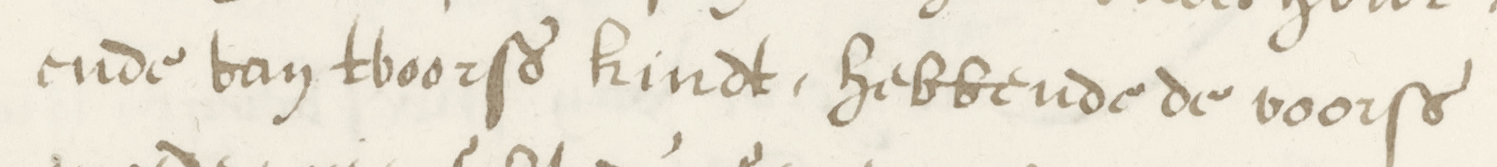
ende van tvoors kindt, hebbende de voors
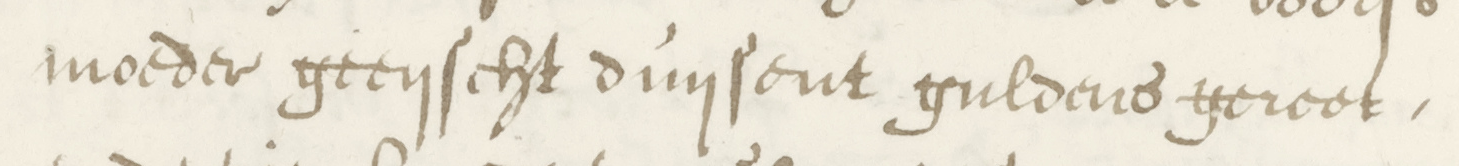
moeder geeyscht duysent guldens gereet,
